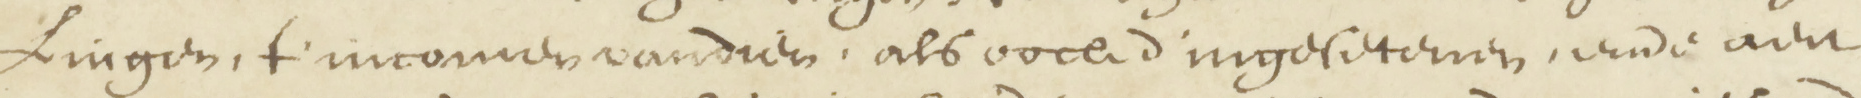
Lingen, t‛incomen vandien, als oock d‛ingesetenen, ende aen
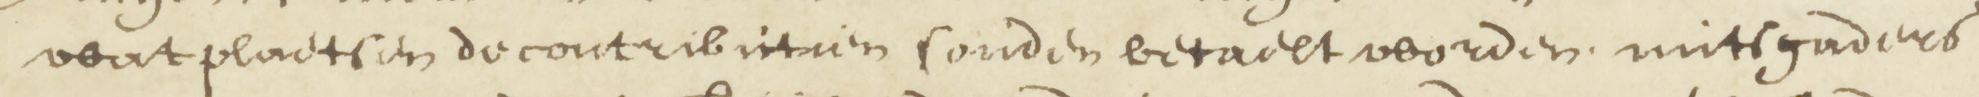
wat plaetsen de contributien souden betaelt worden, mitsgaders
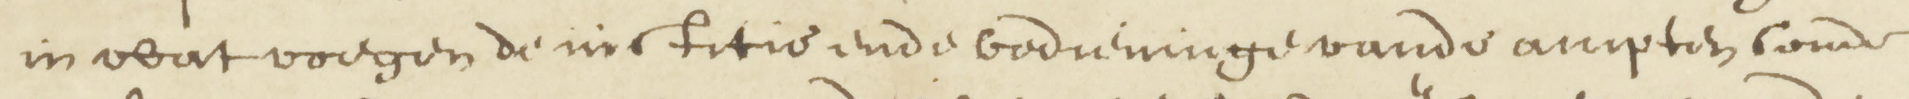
in wat voegen de iustitie ende bedieninge vande ampten soude
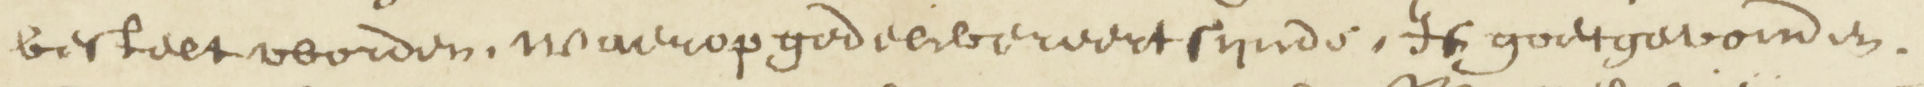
bestelt worden. Waerop gedelibereert synde, Is goetgevonden,
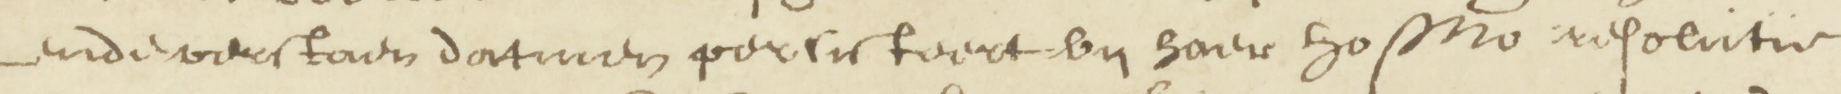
ende verstaen datmen persisteert by haer hoMo resolutie
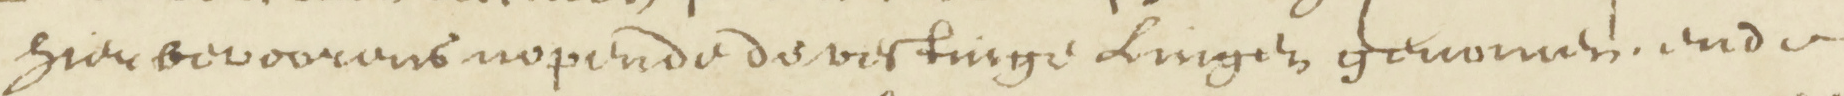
hier bevoorens nopende de vestinge Lingen genomen, ende
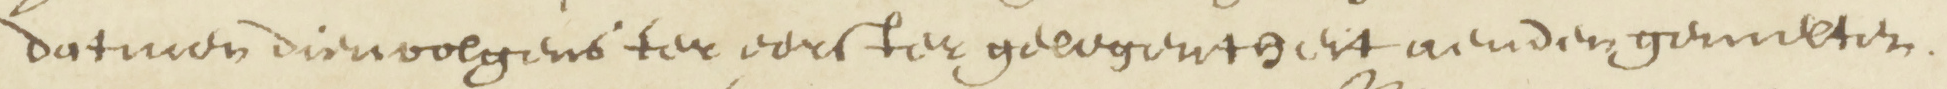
datmen dienvolgens ter eerster gelegentheit aen den gemelten
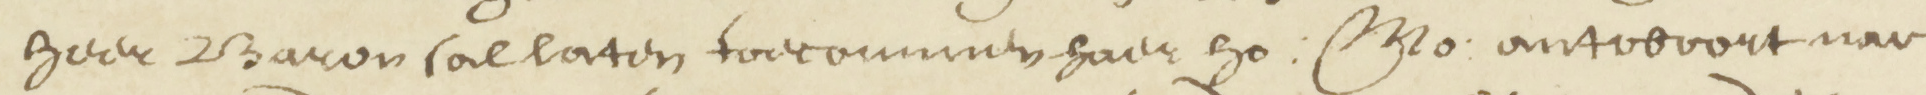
heere Baron sal laten toecommen haer ho:Mo: antwoort nae
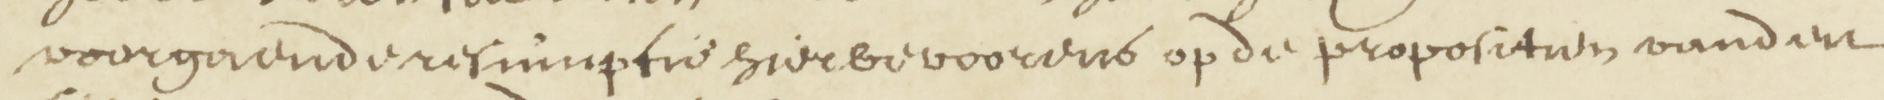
voorgaende resumptie hierbevoorens op de propositien vanden
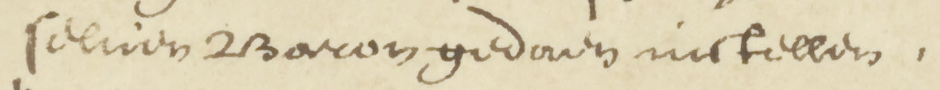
seluen Baron gedaen instellen.
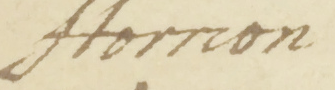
Horrion
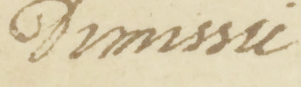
Dimissie
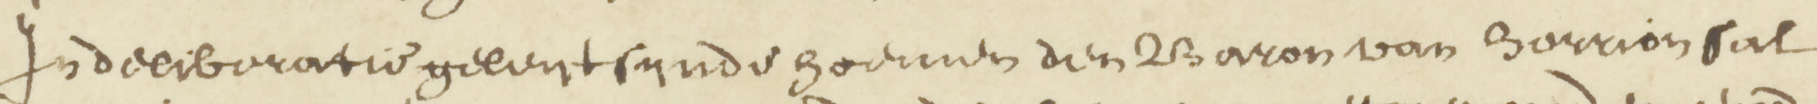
In deliberatie geleyt synde hoemen den Baron van horrion sal
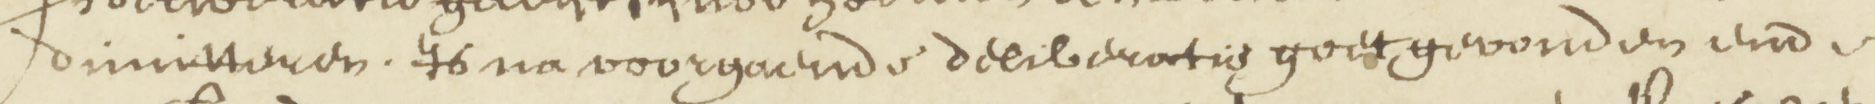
dimitteren. Is na voorgaende deliberatie goetgevonden ende
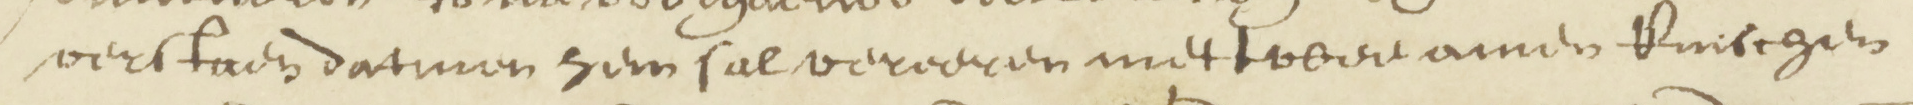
verstaen datmen hem sal vereeren met twee amen Rinschen
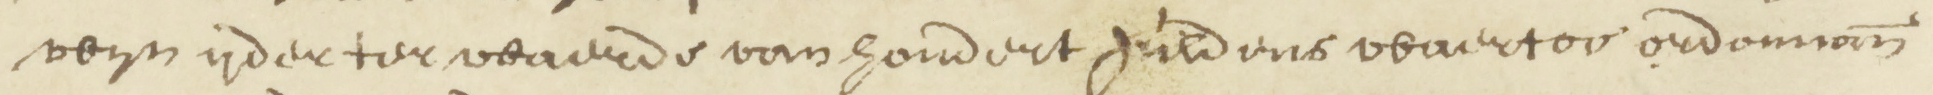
wyn ijder ter waerde van hondert guldens waertoe ordonnan
